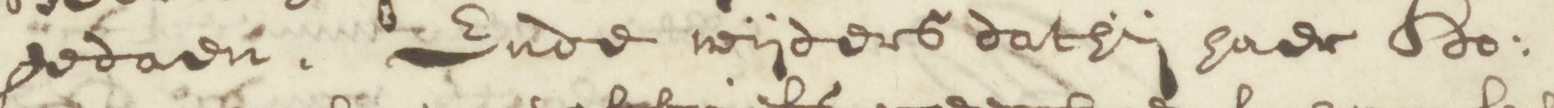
gedaen. Ende wijders dat hij haer Ho:
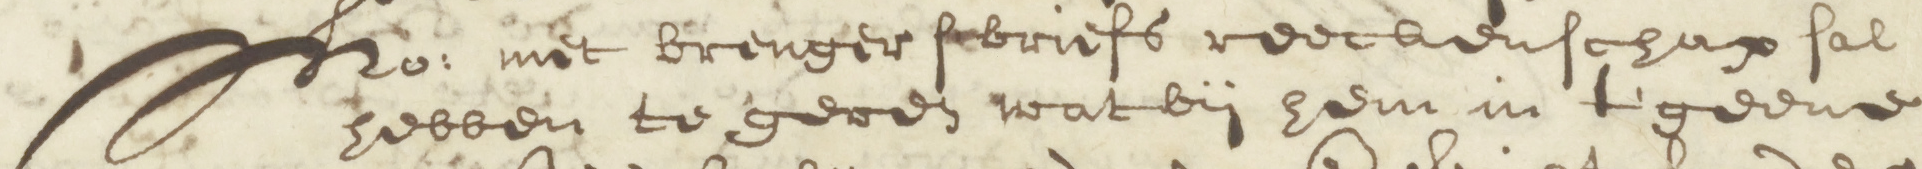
Mo: met brenger s‛briefs reeckenschap sal
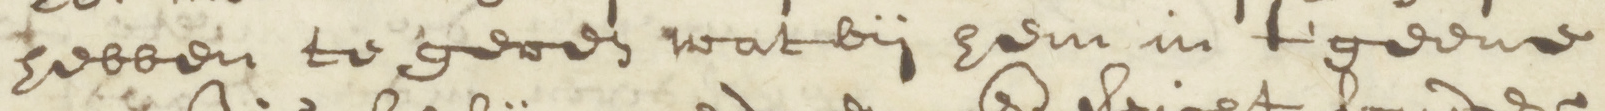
hebben te geven wat bij hem in t‛ geene
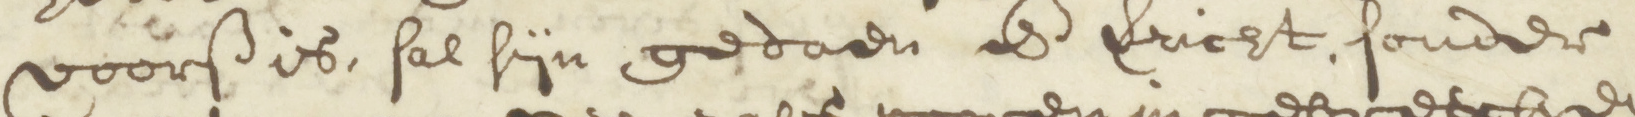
voors is, sal sijn gedaen en vricht, sonder
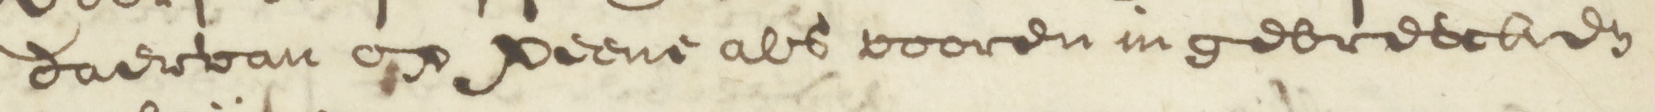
daervan op peene als vooren in gebreecken
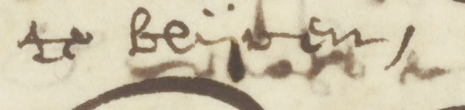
te blijven.
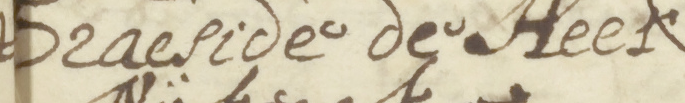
Præside de Heer
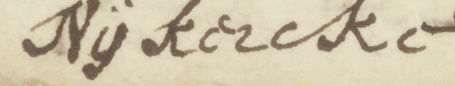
Nijkercke.
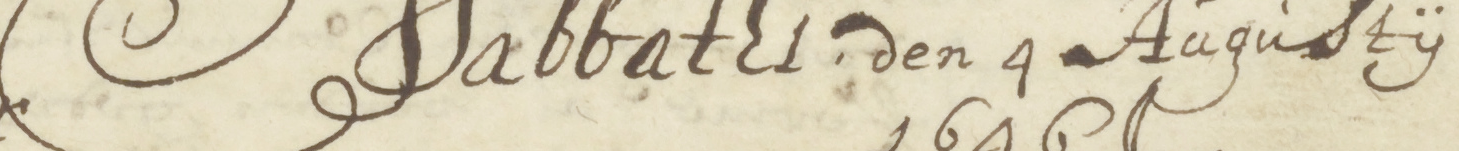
Sabbatli, den 4 Augustij
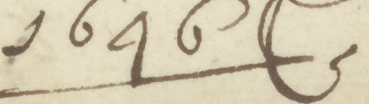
1646
